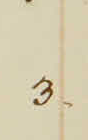3
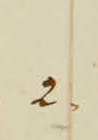2
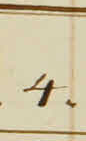4
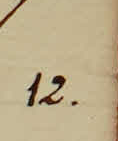12.
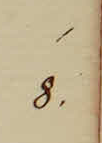8.
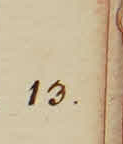13.
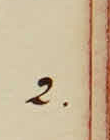2.
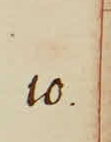10.
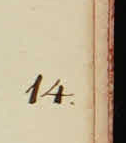14.
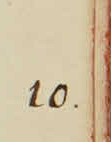10.
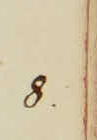8.
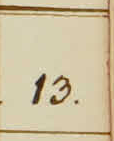13.
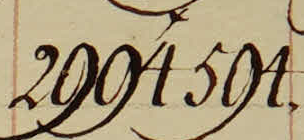2994594
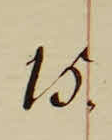15
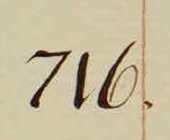716
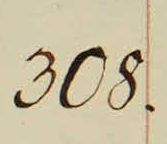308
